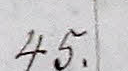45.
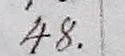48.
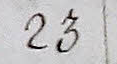23
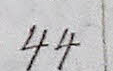44
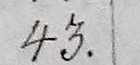43.
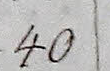40
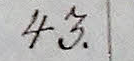43.
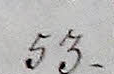53
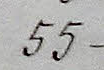55
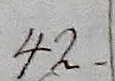42
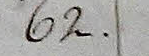62.
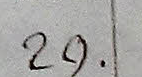29.
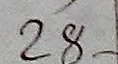28
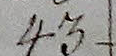43
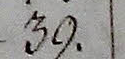39.
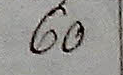60
